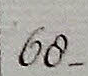68
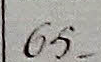65
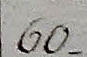60
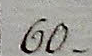60
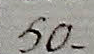50
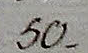50
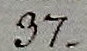37
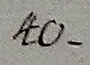40
